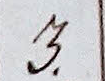3.
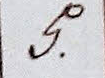5.
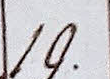19.
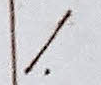1.
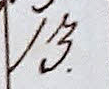13.
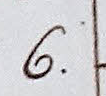6.
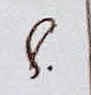8.
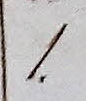1.
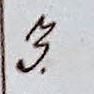3.
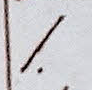1.
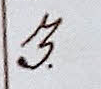3.
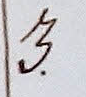3.
